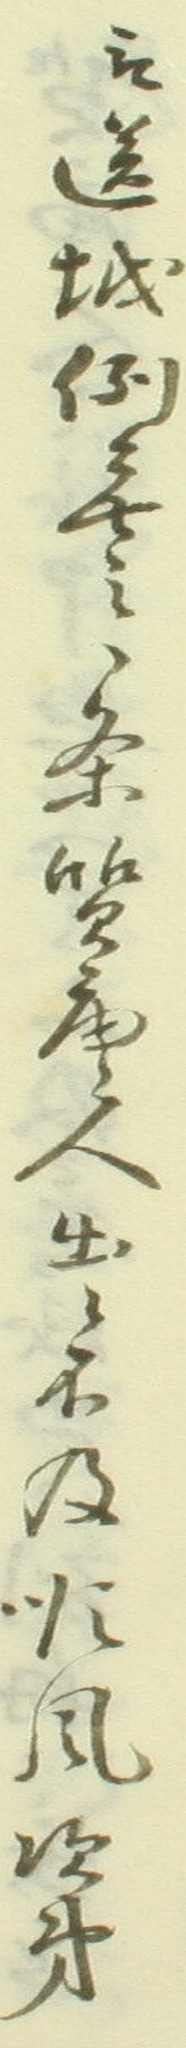被送越例無之候条質唐人出に不及順風次第
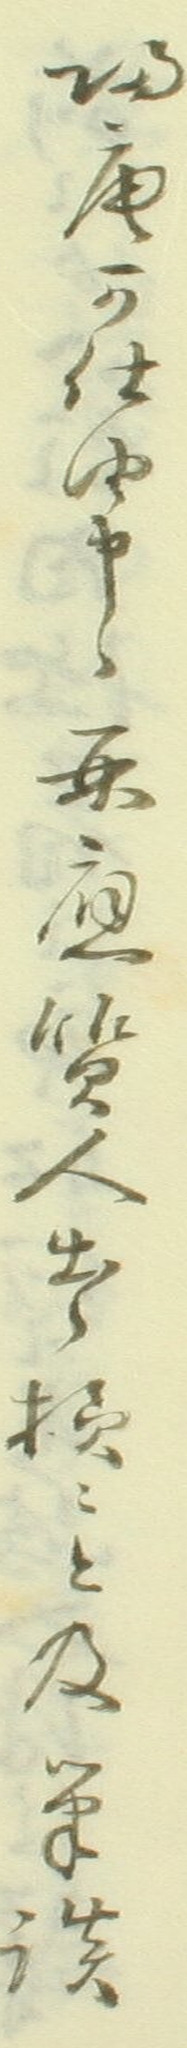帰唐可仕由申候再応質人出候様にと及筆談
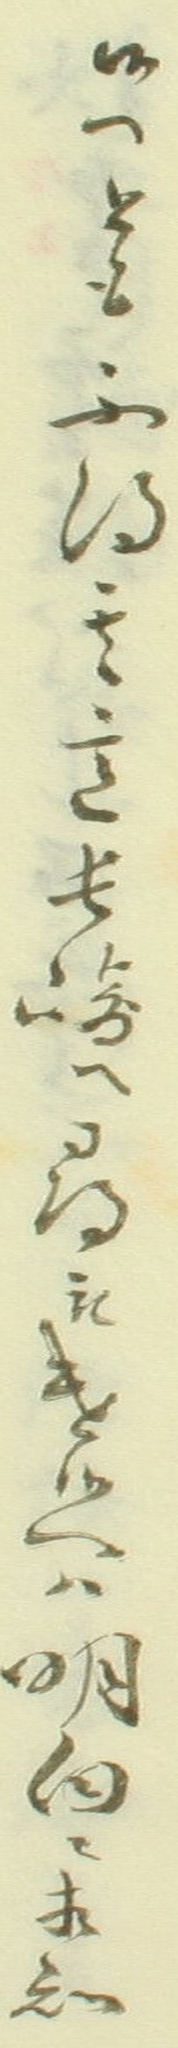候へとも不得其意長崎へ尋被遣候へは明白に相知
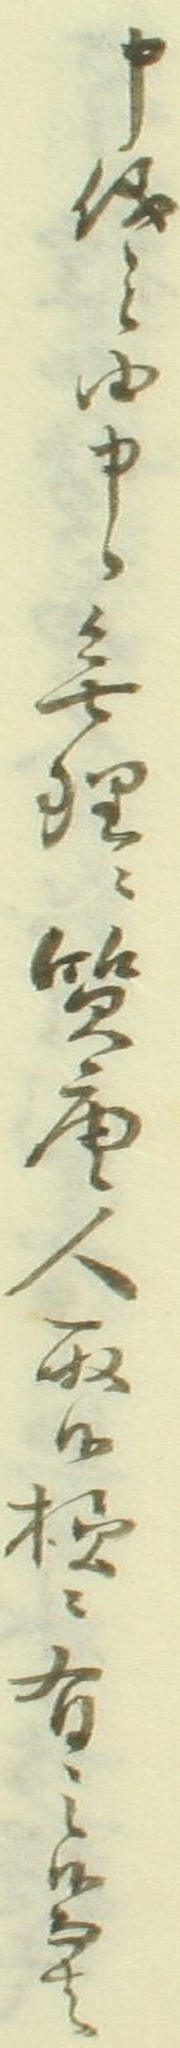申儀候由申候無理に質唐人取候様に有之候而は
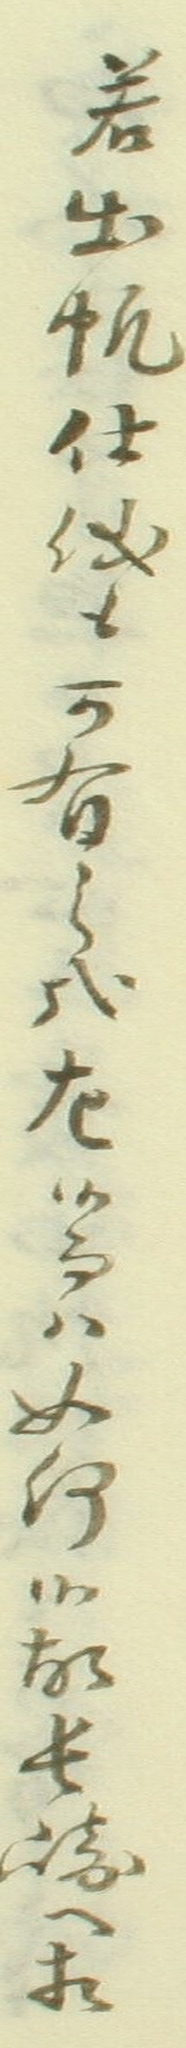若出帆仕儀も可有之哉左候而は如何候故長崎へ相
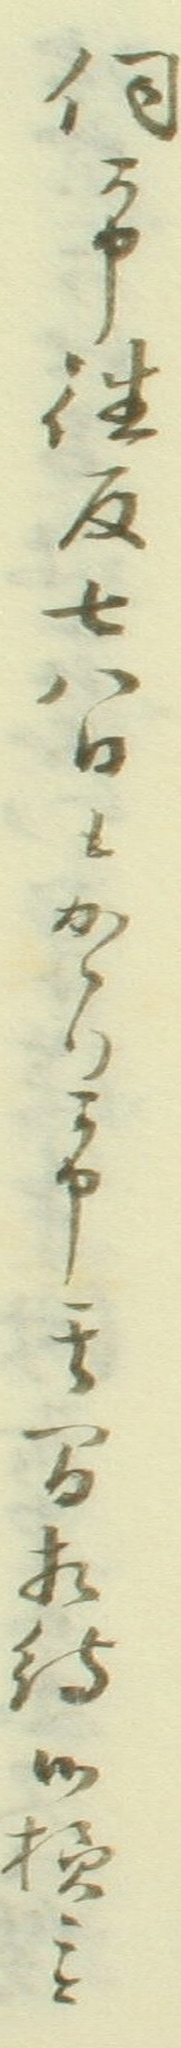伺可申往反七八日もかゝり可申其間相待候様にと
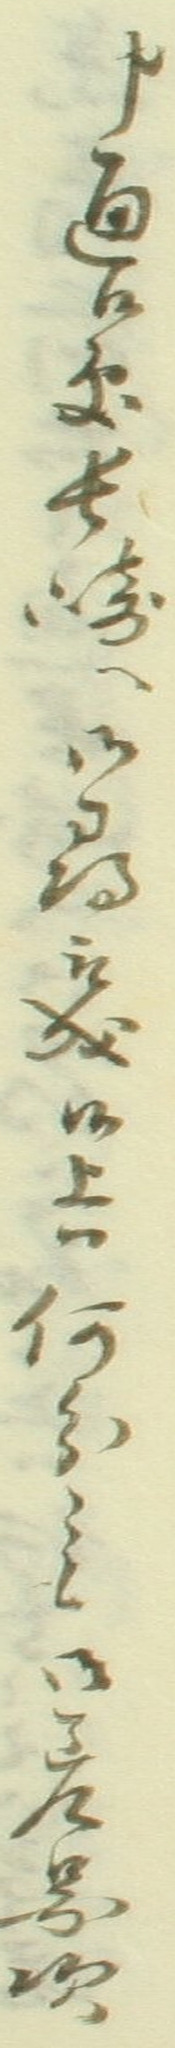申通候処長崎へ御尋被成候上は何分にも御指図次
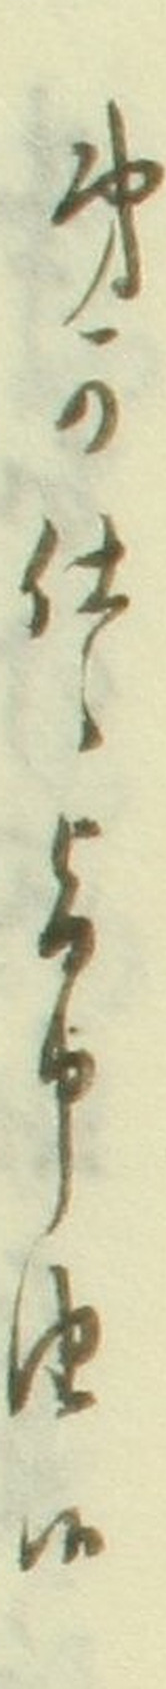第可仕候旨申由候
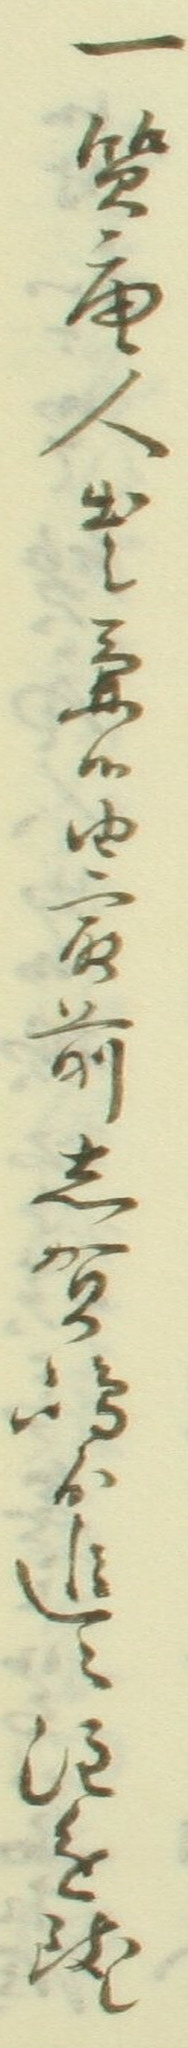一質唐人出し済候由最前志賀島ゟ追々注進致し

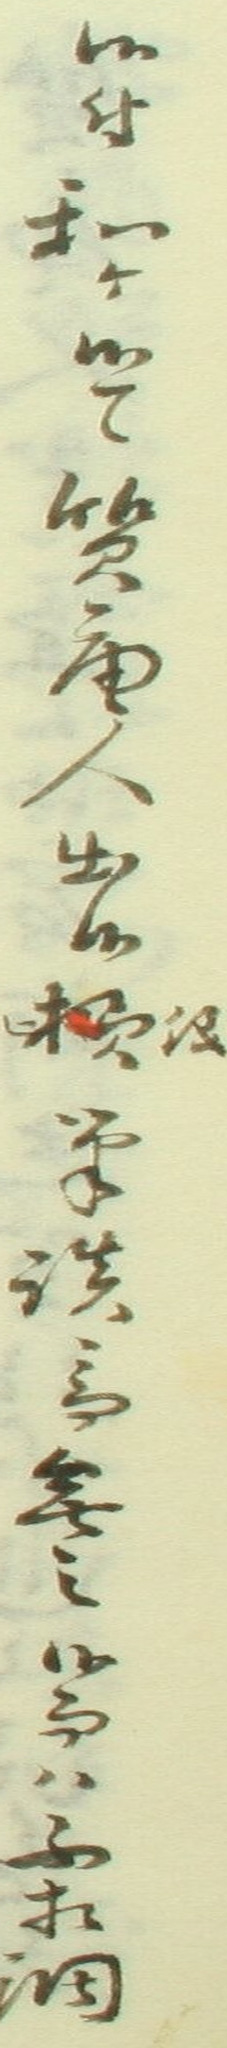候に付和ヶ候て質唐人出候様儀筆談に而無之は不相調
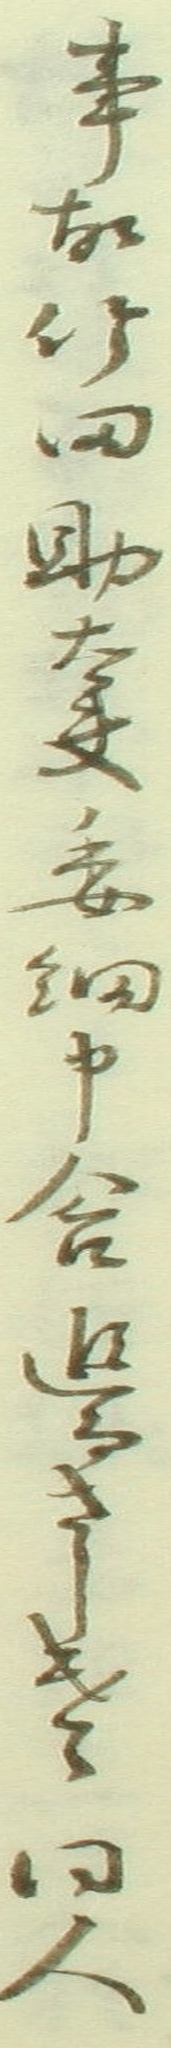事故竹田助太夫委細申合追而さし遣候同人
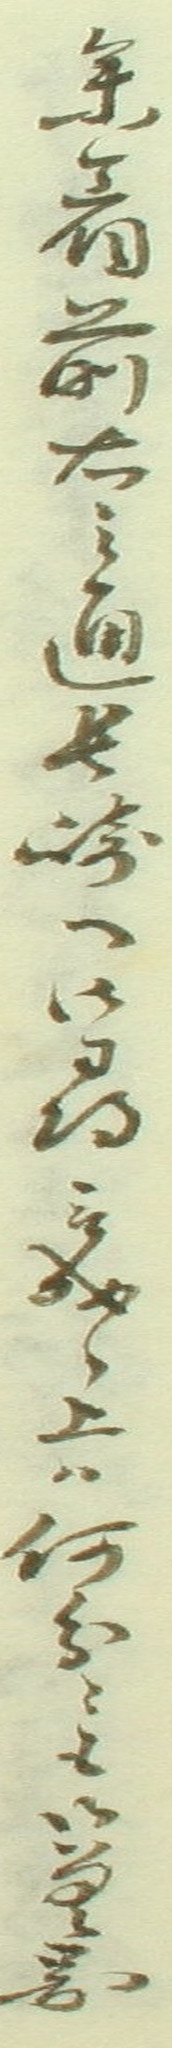参着前右之通長崎へ御尋被成候上は何分にも御差図
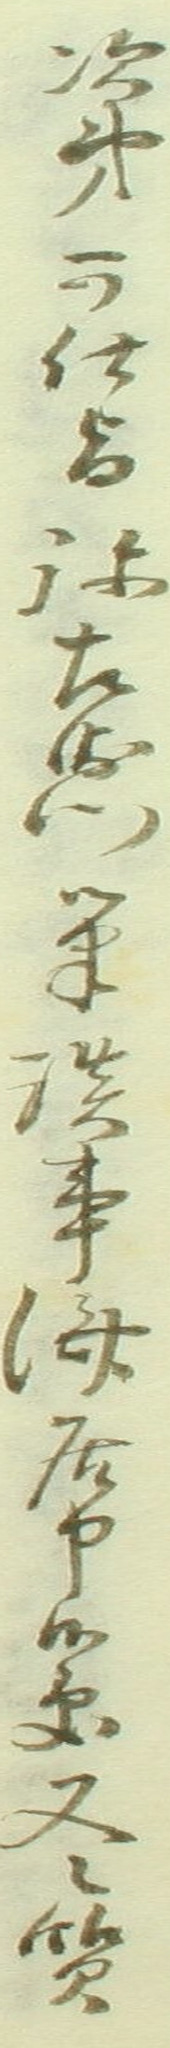次第可仕旨弥右衛門筆談事済居申候処又々質
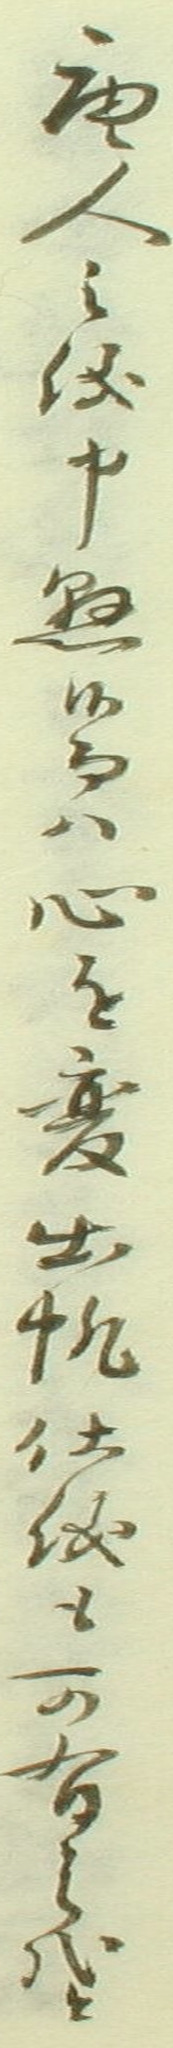唐人之儀申懸候而は心を変出帆仕儀も可有之哉と
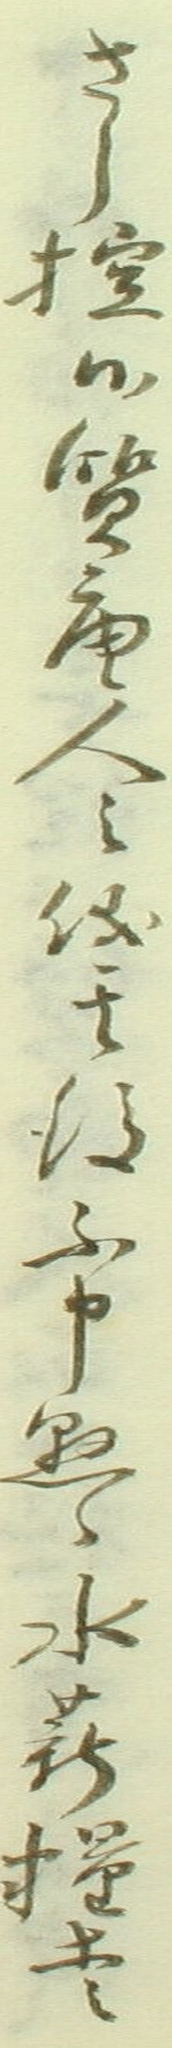さし控候質唐人之儀其後不申懸候水薪糧等之
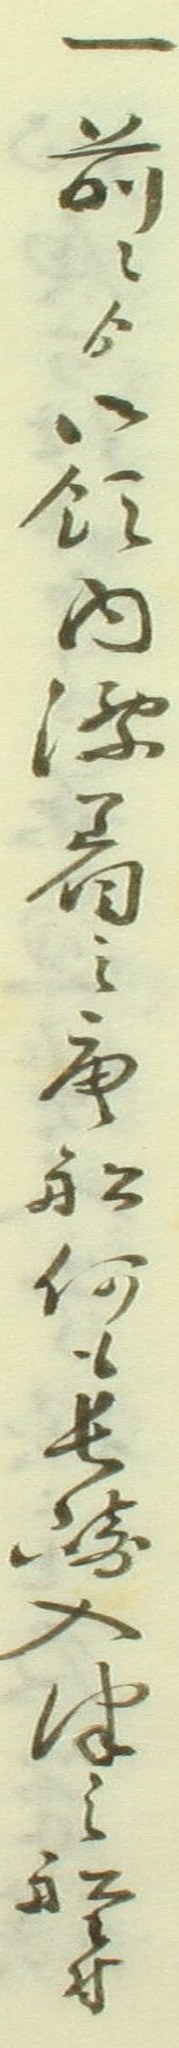一前々ゟ御領内漂着之唐船何も長崎入津之船に付
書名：異国船漂着記
